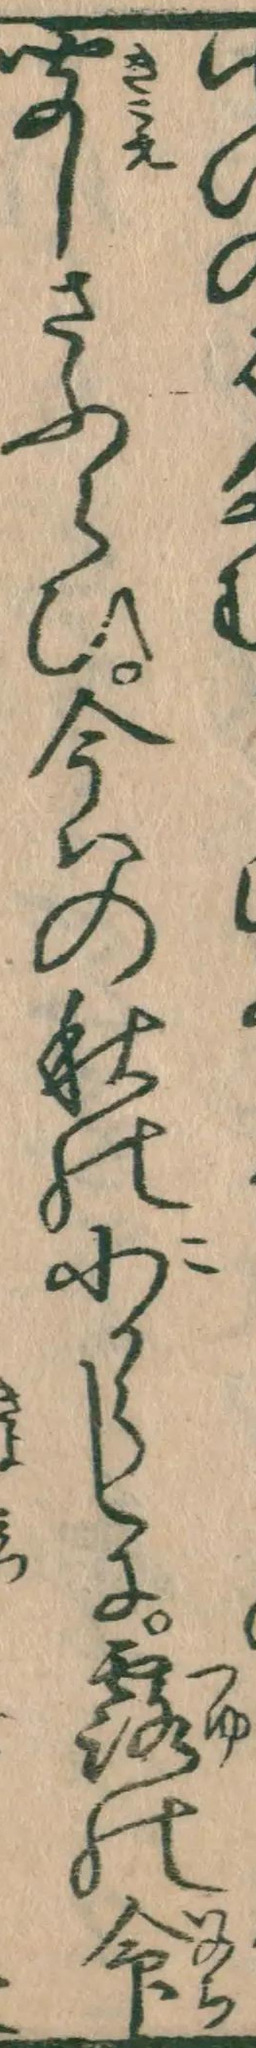聞しさふらひ。今はの秋の小からしに。露の命
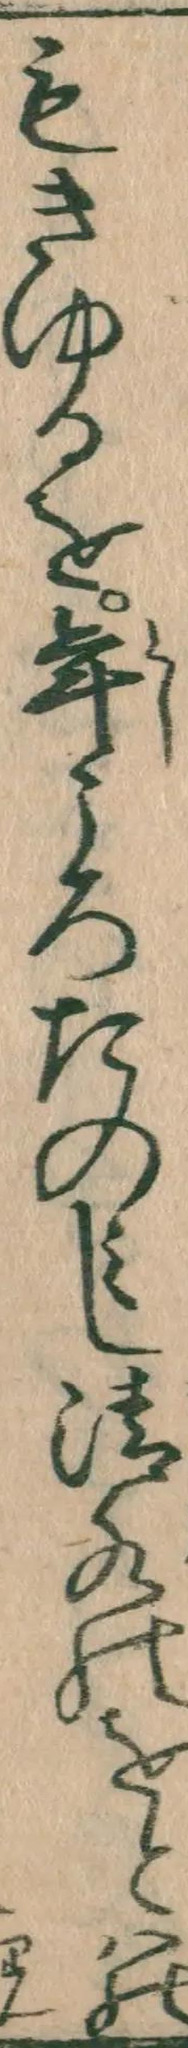もきゆるを。年ころたのみし清水のをとはの
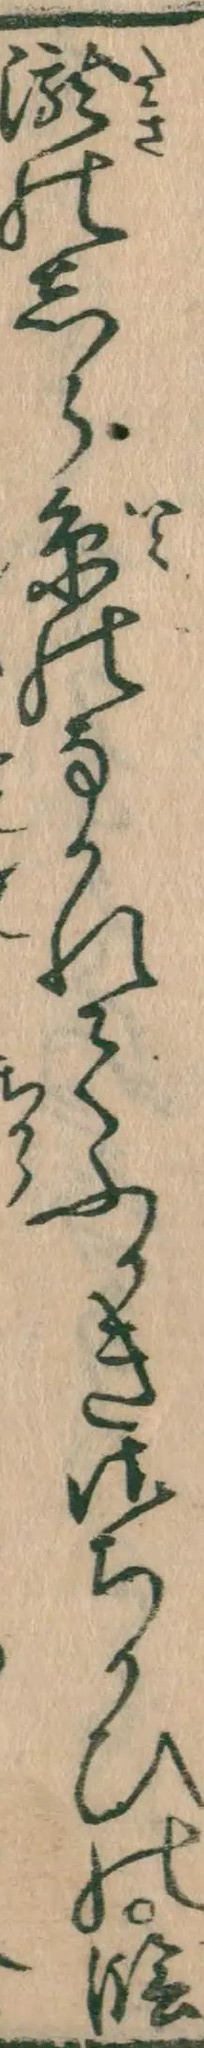瀧のしら糸のなかれてふかき御ちかひの。臨
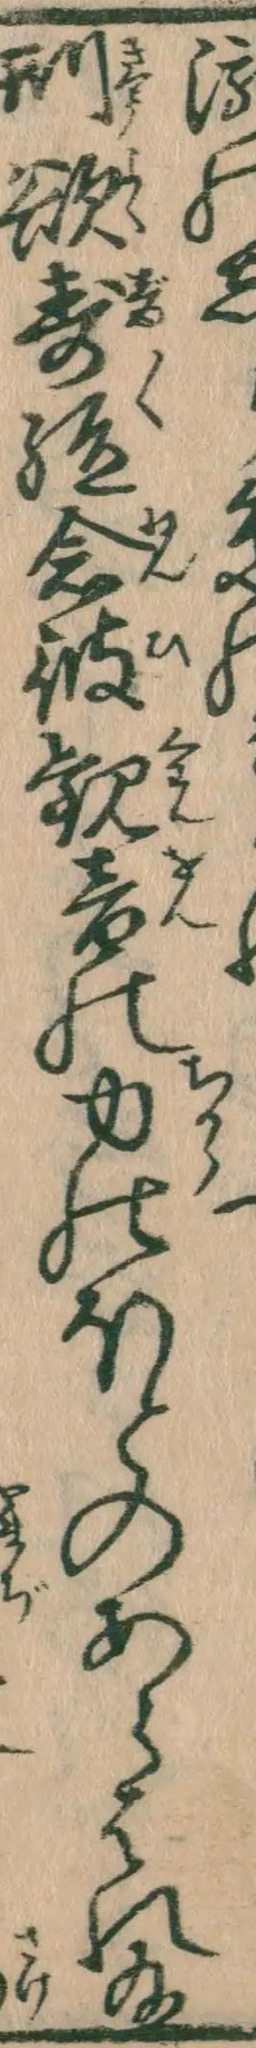刑欲寿終念彼観音の力のほとのあらはれ給
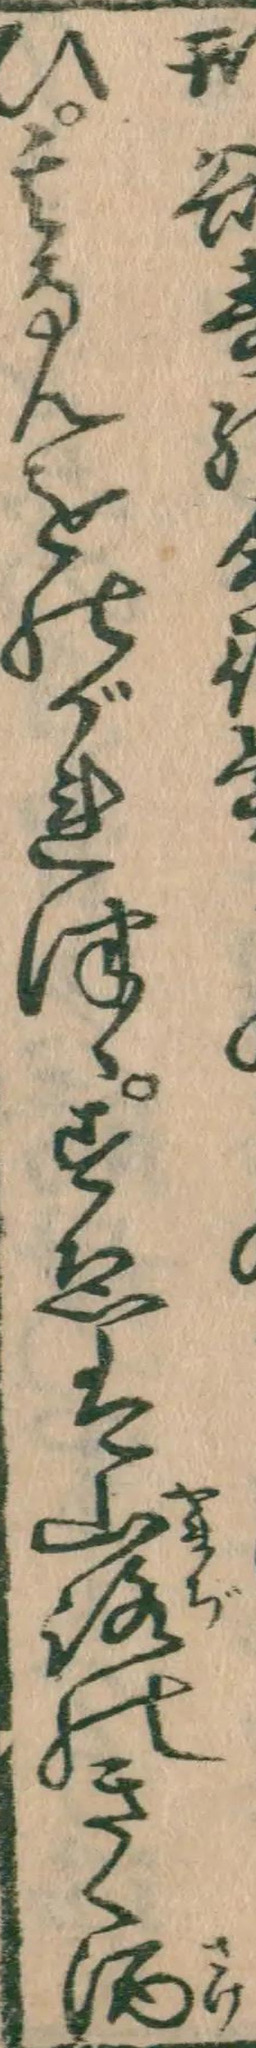ひ。其なんをのがれつゝ。すゑは山路のきく酒
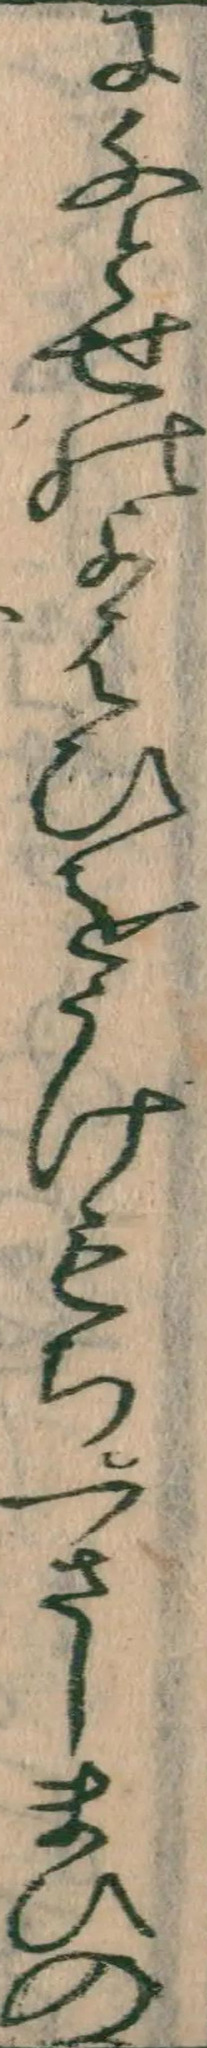に千とせのよはひをうけもち。一さしまひの
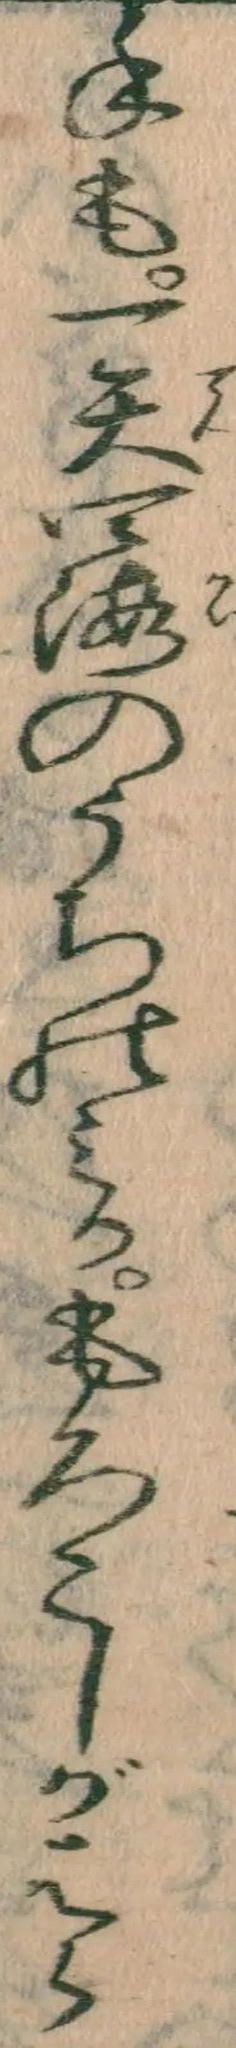手も。一天四海のうちのみか。もろこしがはら
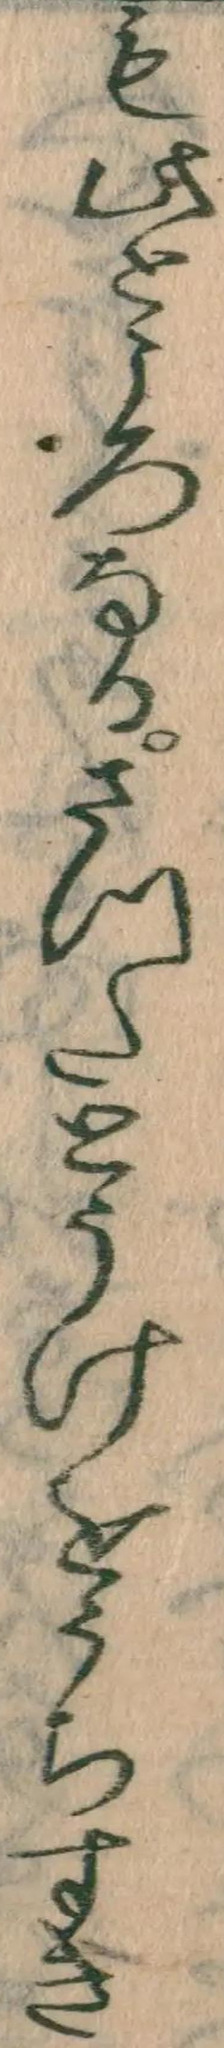も此ところなる。さつたとうけをうちすき
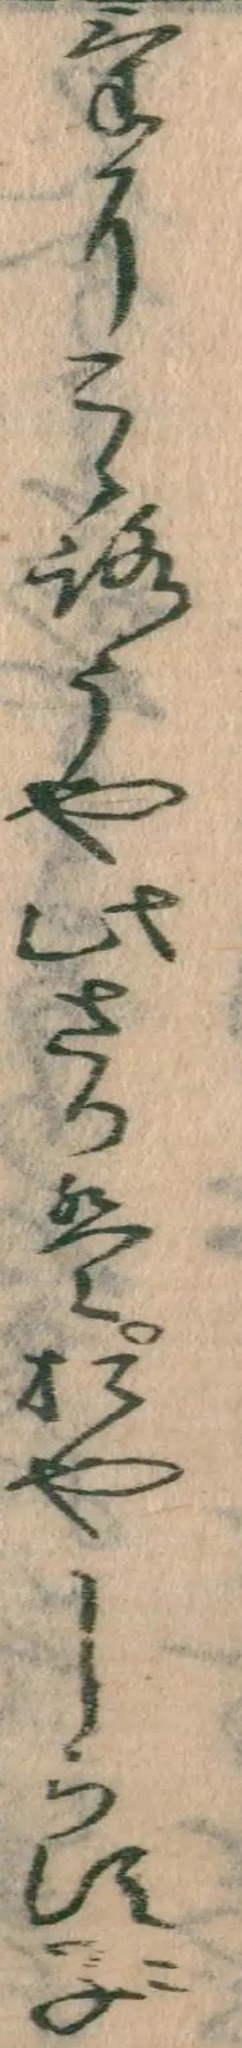けにこゝろうや此さかは。おやしらす子
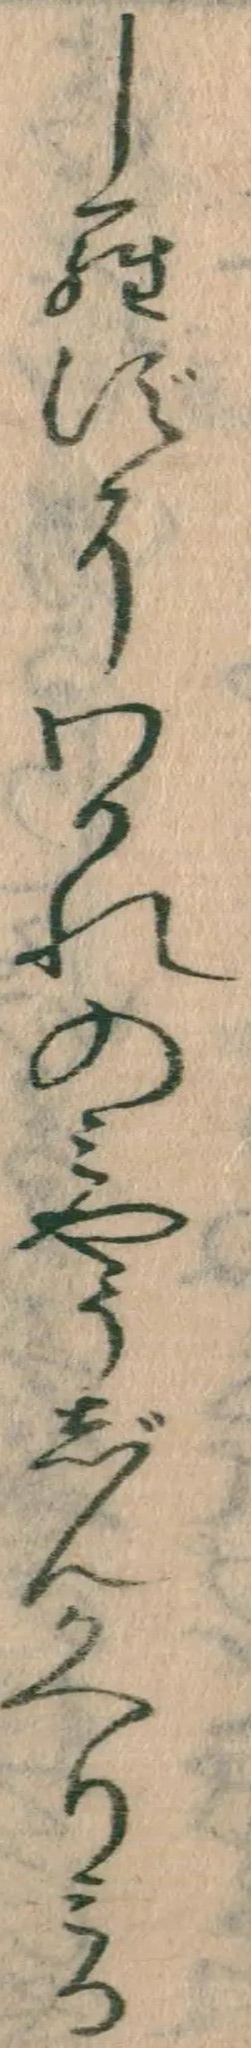しらずにわかれのみやうじんかへりみる
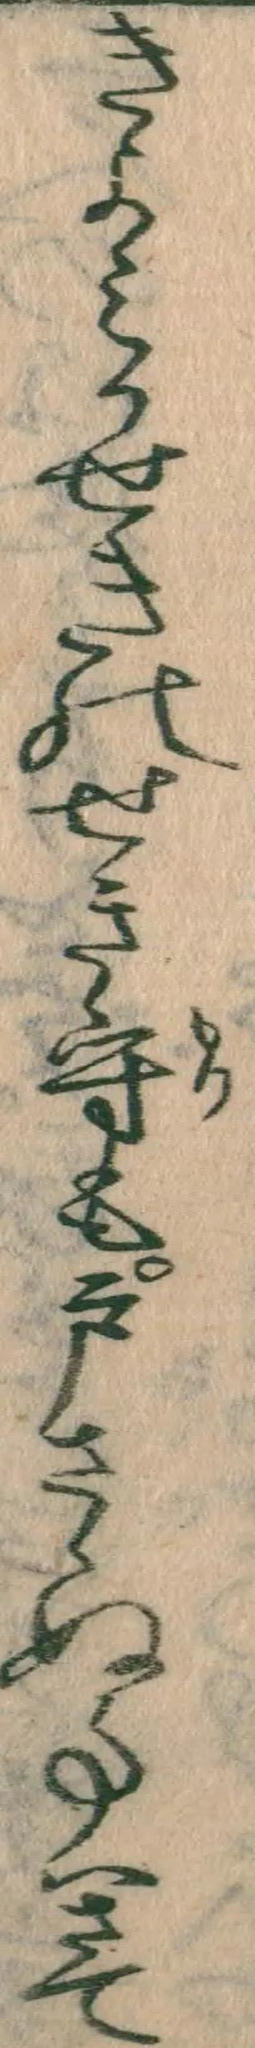きよみかせきのせき守も。戸さゝぬ事はさて
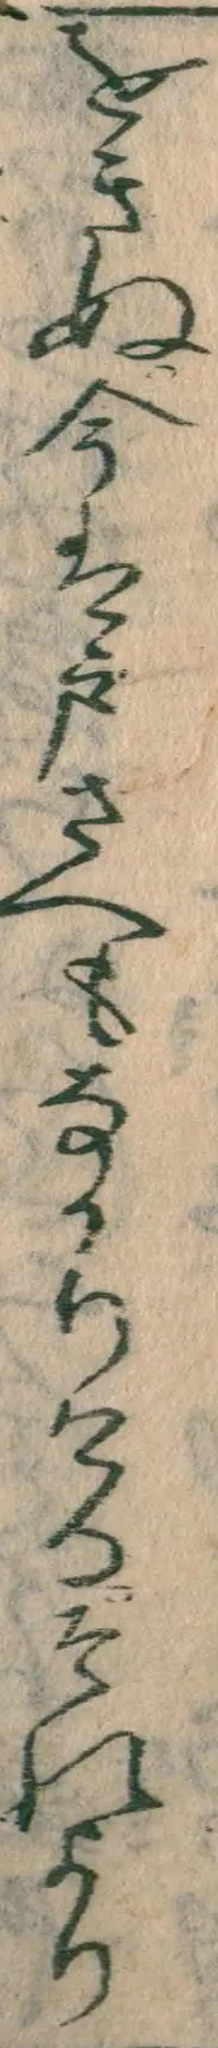をきぬ。今は戸さへもなかりける。それより
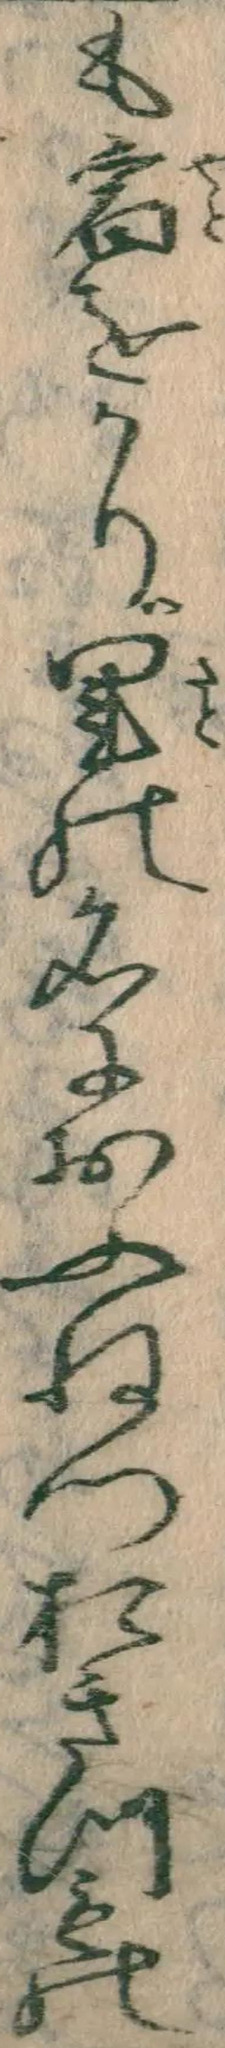も宿をかり。里の名におふねつおきつもの
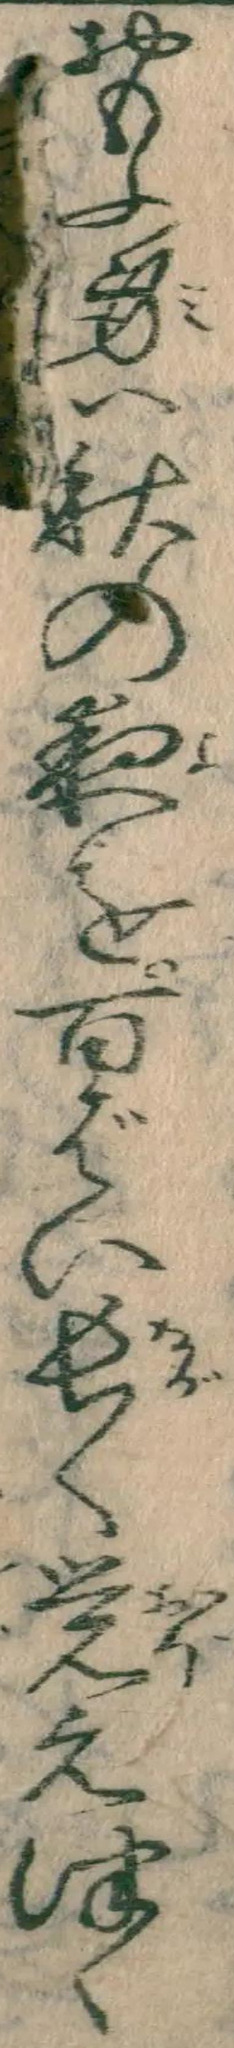おもふ身は秋の夜を。百ばい長く覚えつゝ
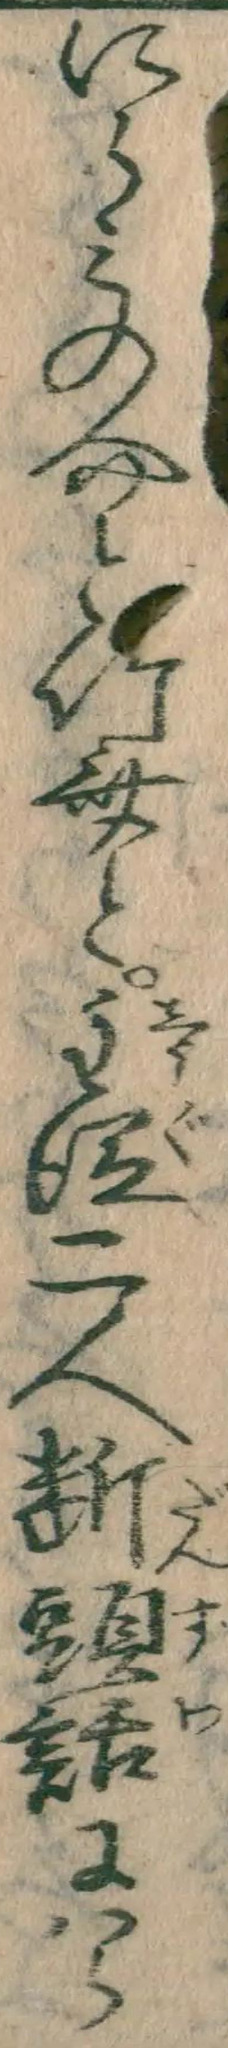にらみの介と竹斎と。主従二人断頭話にはら

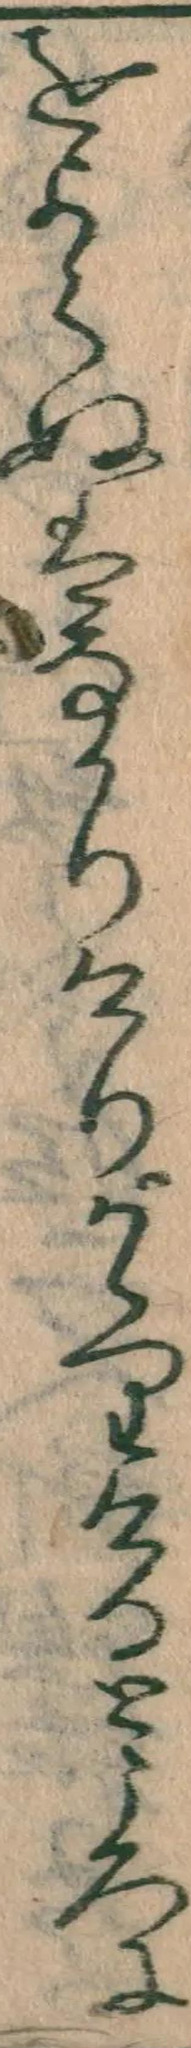をよらぬはなかりけり。かゝりけるところに
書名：竹斎狂歌物語 3巻
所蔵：国立国会図書館 National Diet Library, JAPAN
